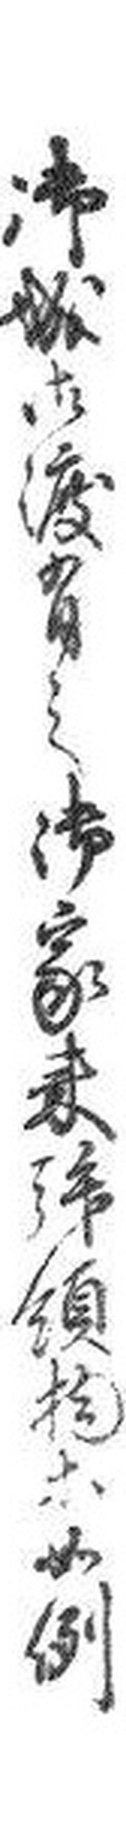御城御渡有之御家来拝領物等如例
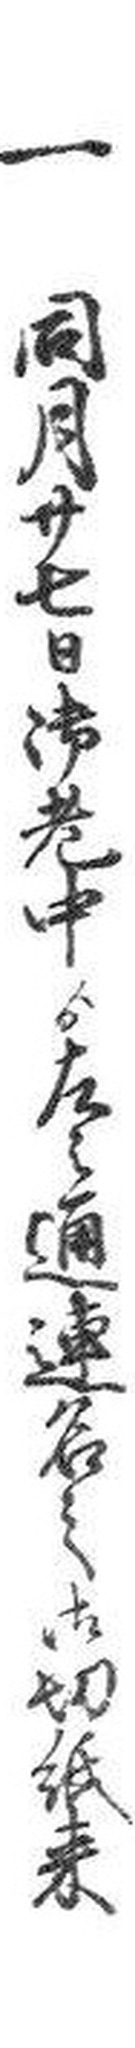一同月廿七日御老中ゟ左之通連名之御切紙来
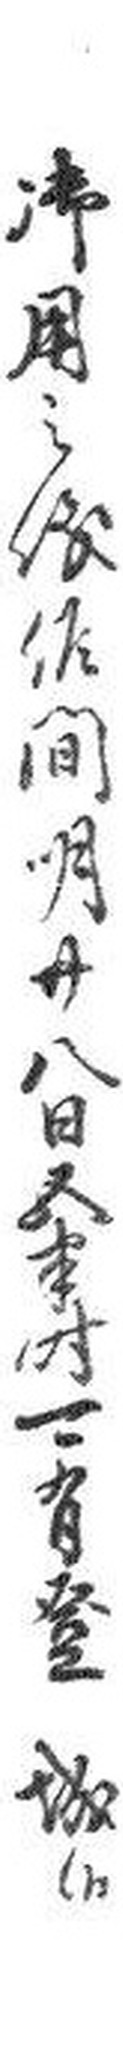御用之儀候間明廿八日五半時可有登城候
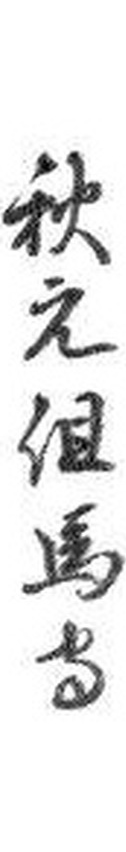秋元但馬守
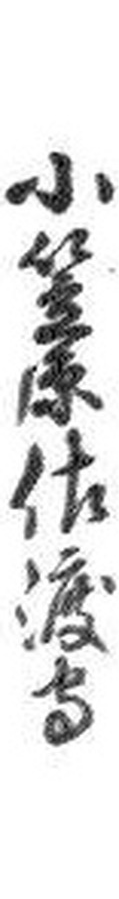小笠原佐渡守
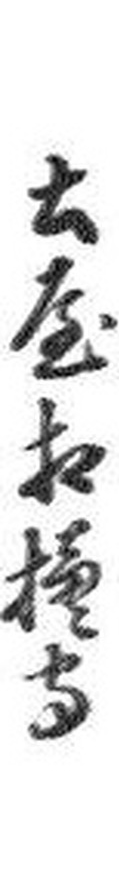土屋相模守
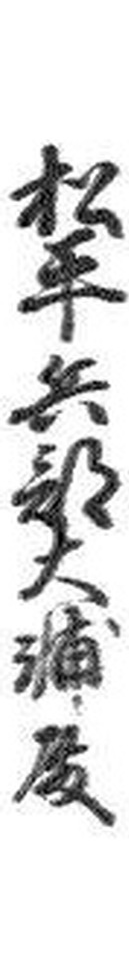松平兵部大輔殿
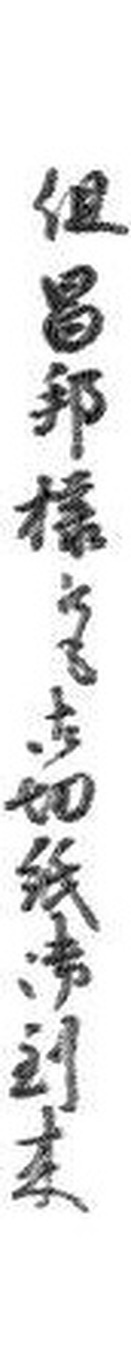但昌邦様江も御切紙御到来
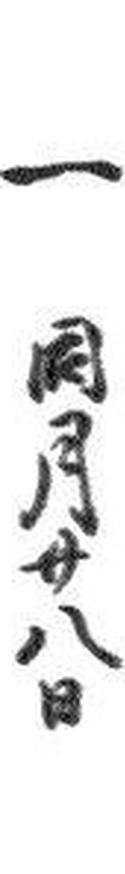一同月廿八日
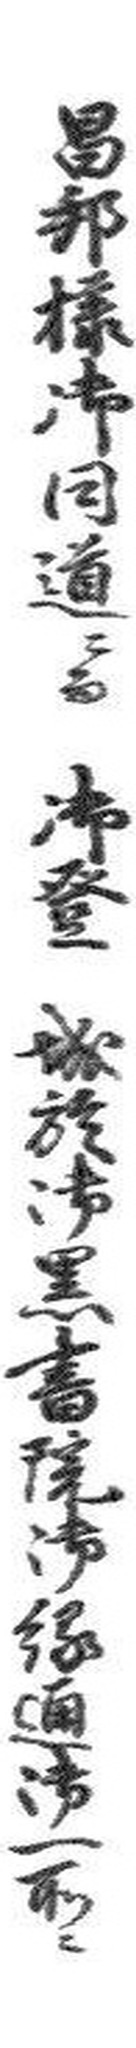昌邦様御同道ニ而御登城於御黒書院御縁通御一所ニ
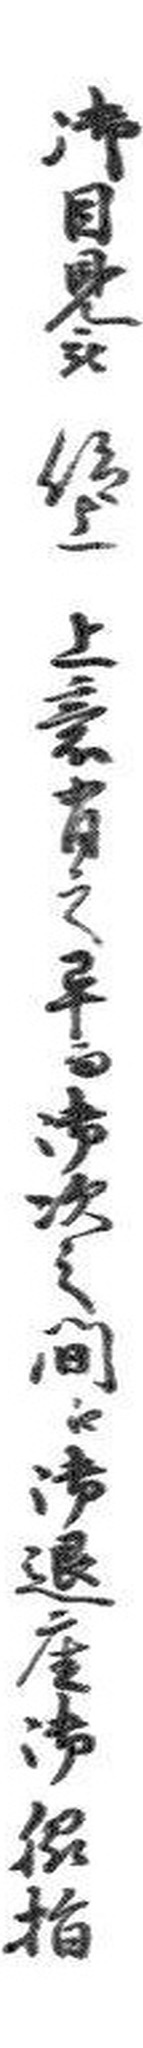御目見被仰上上意有之畢而御次之間江御退座御脇指
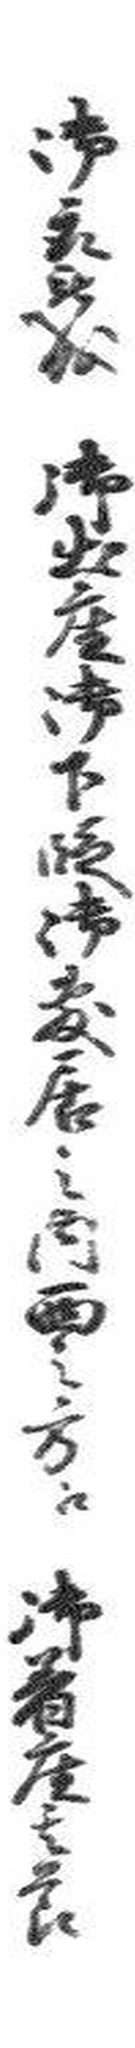御取被成御出座御下段御敷居之内西之方江御着座其節

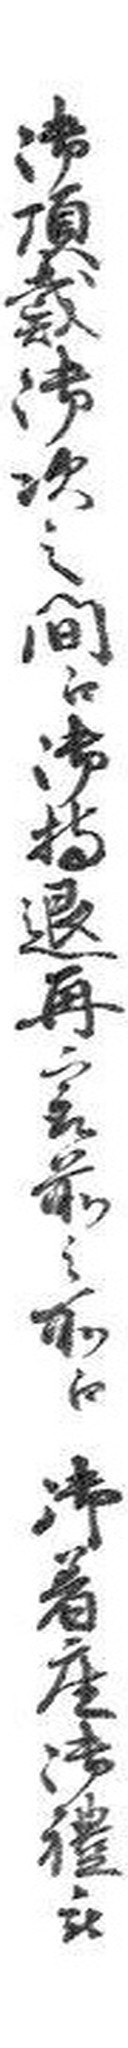御頂戴御次之間江御持退再最前之所江御着座御礼被
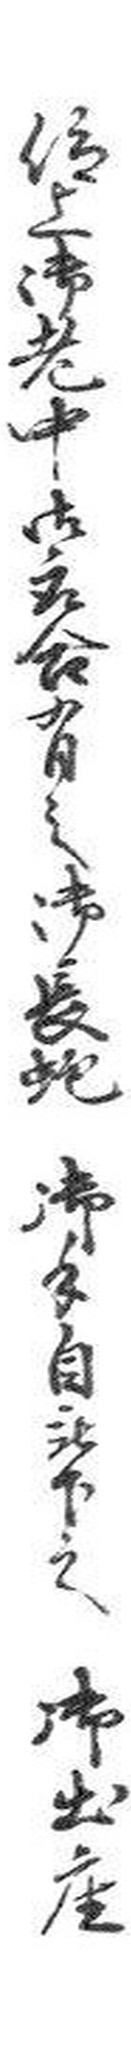仰上御老中御取合有之御長蚫御手自被下之御出座
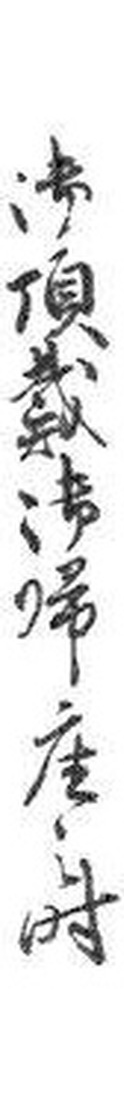御頂戴御帰座之時
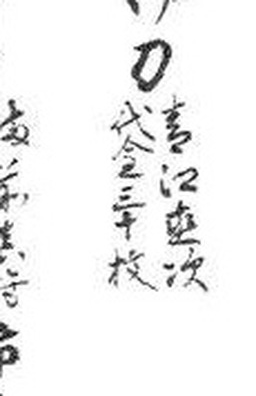代金三十枚
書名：家譜 二十三 吉品公 従宝永元年到同二年
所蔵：福井県文書館 Fukui Prefectural Archives
